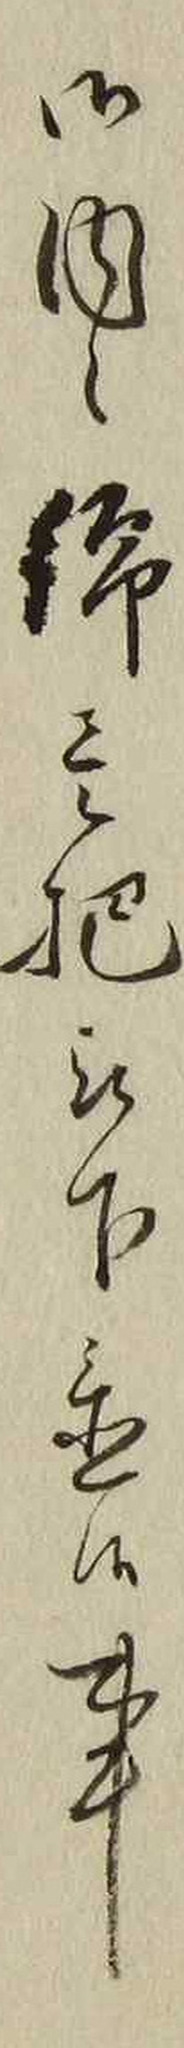御内々綿壱把被下置候事
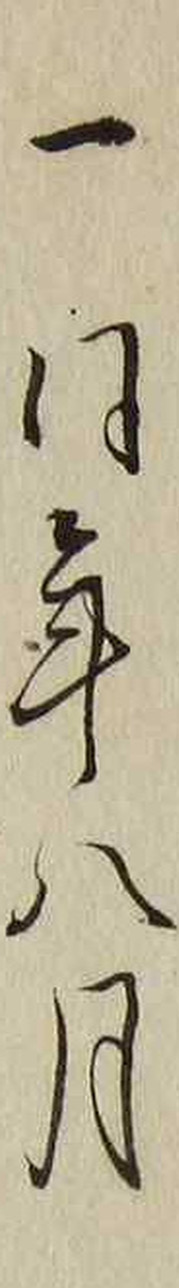一同年八月
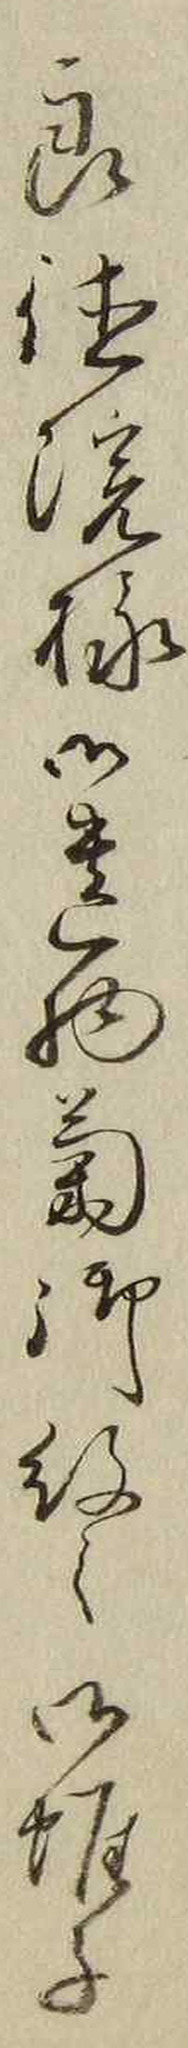良徳院様御遺物菊御紋之御帷子
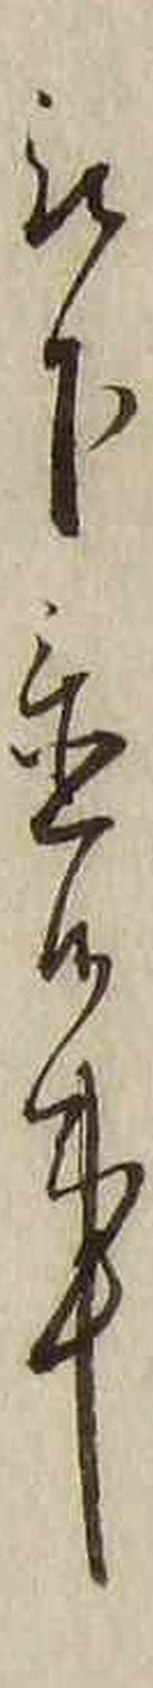被下置候事

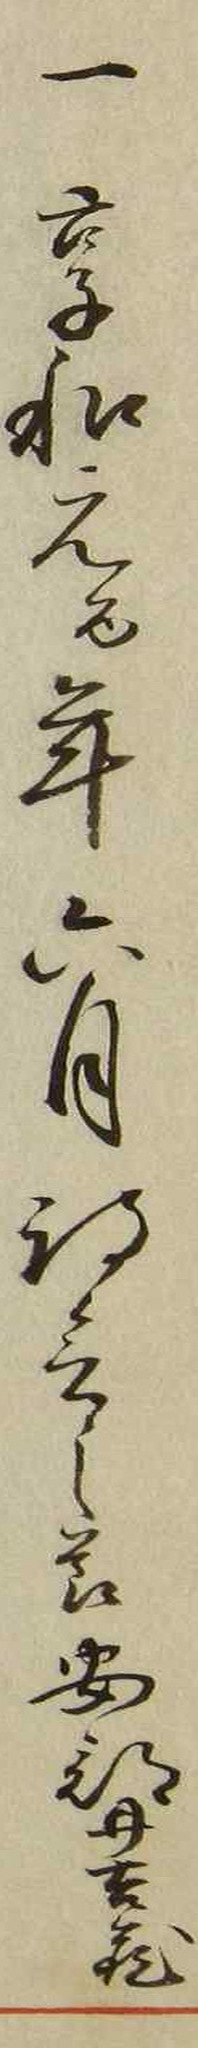享和元酉年六月詩会之節安部井吉蔵
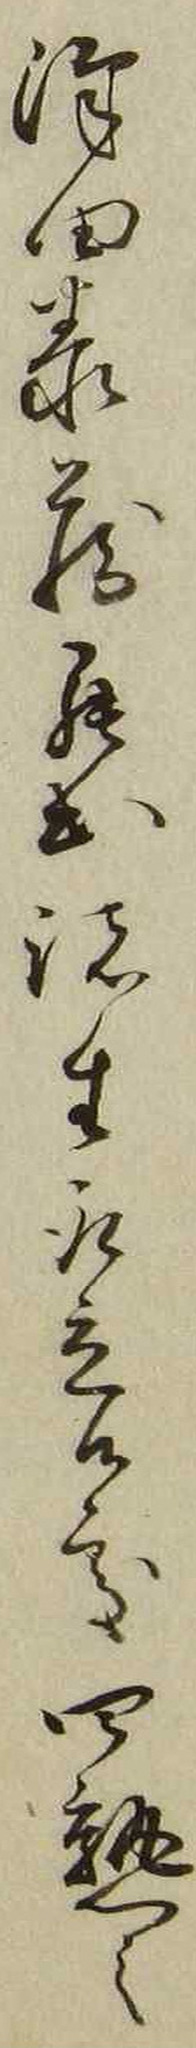澤田泰蔵罷出諸生取立候処四熟之
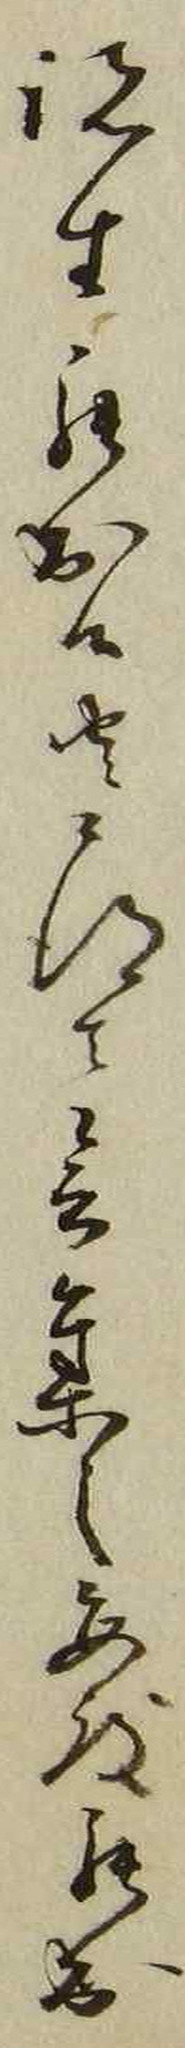諸生罷出候由に候得は会集之毎度罷出
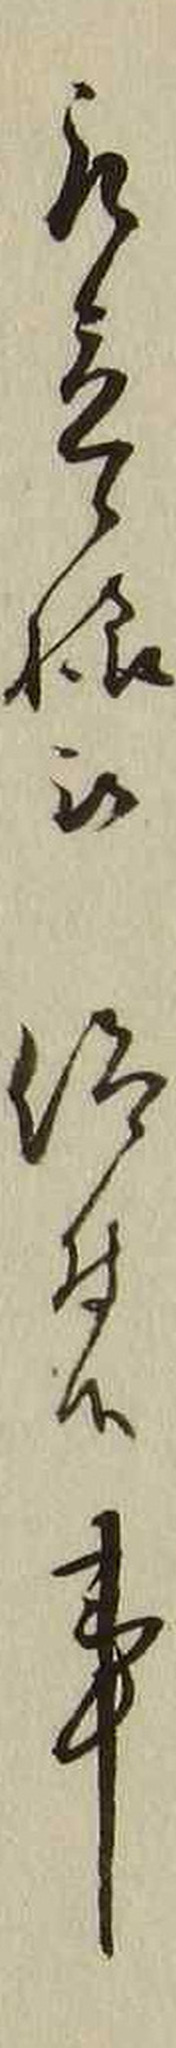取立候様被仰付候事
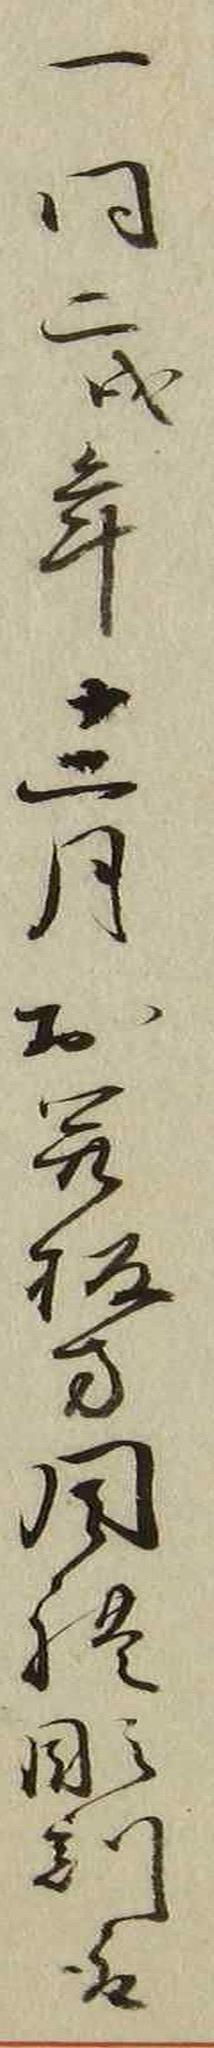一同戌年十二月於開板方周礼彫刻取
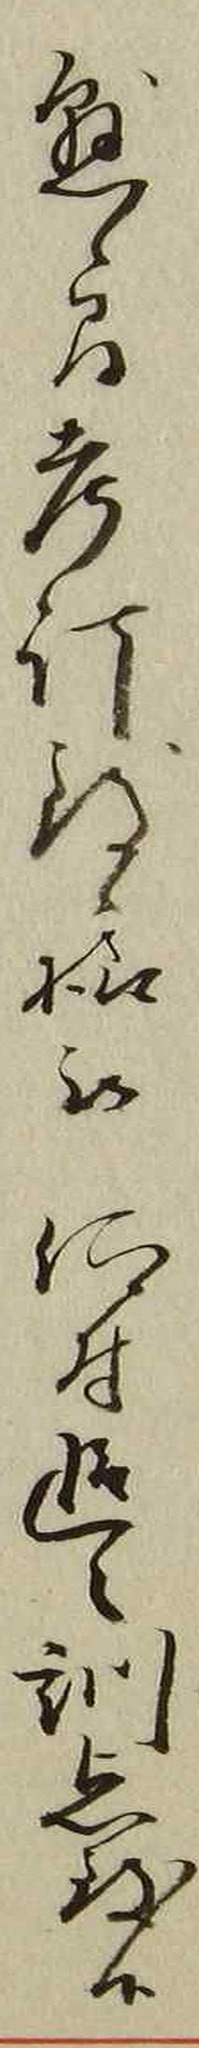懸候間考行致候様被仰付追々訓点致候
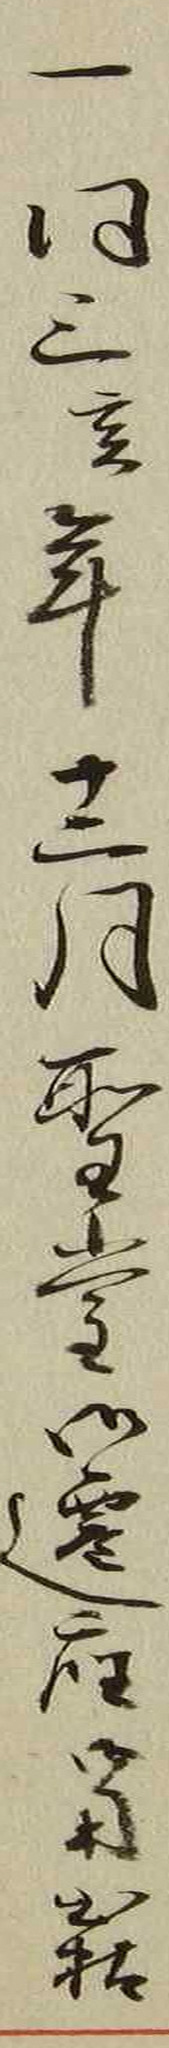一同三亥年十二月聖堂御遷座御用出精
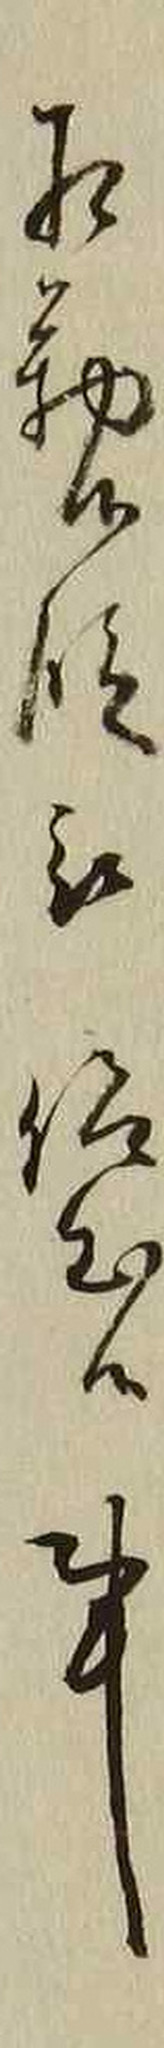相勤候段被仰出候事
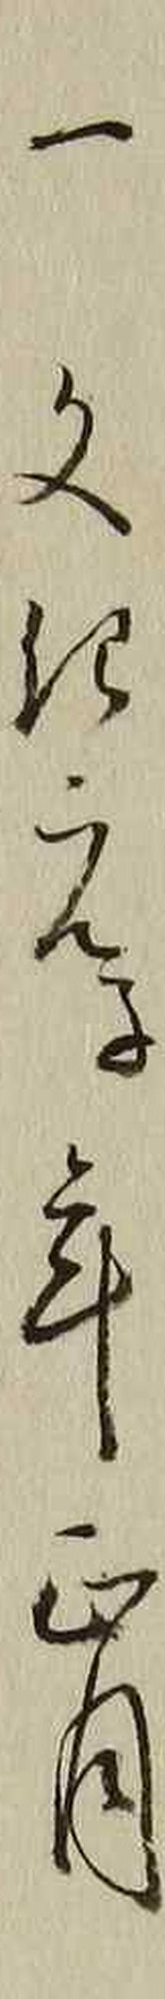一文化元子年正月
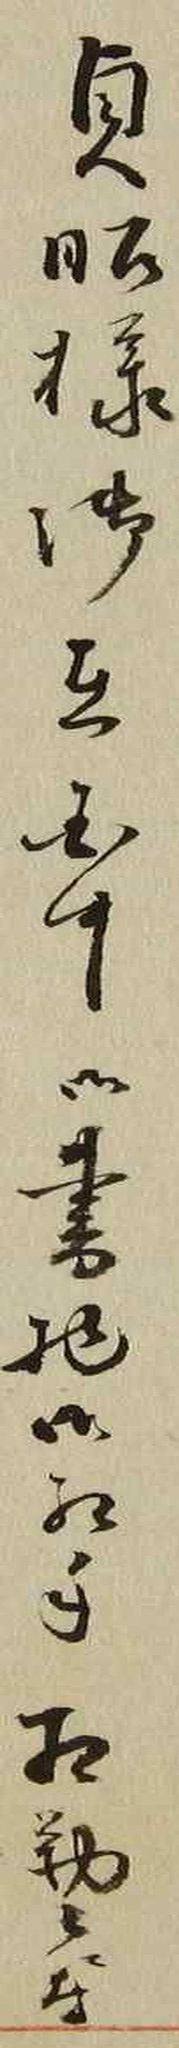貞昭様御在国中御書物御相手相勤候に付
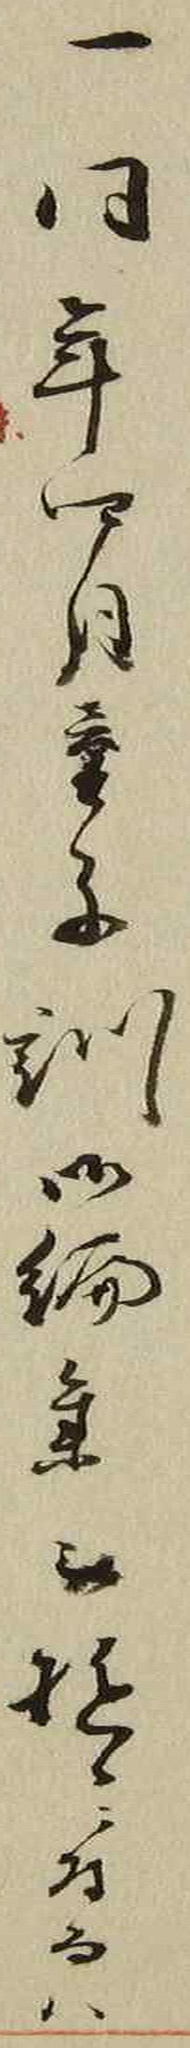一同年四月童子訓御編集被遊候に付ては
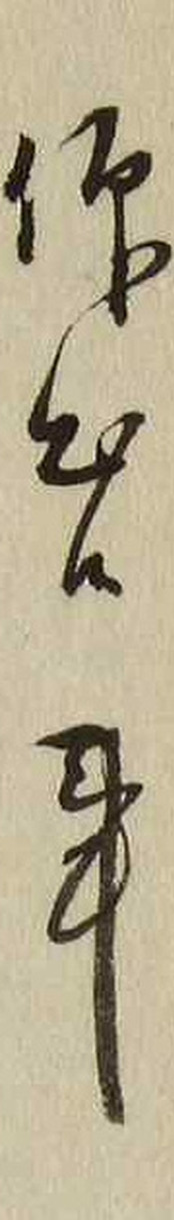仰出候事
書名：諸士系譜　巻之3　い之部3
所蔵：会津若松市立会津図書館
